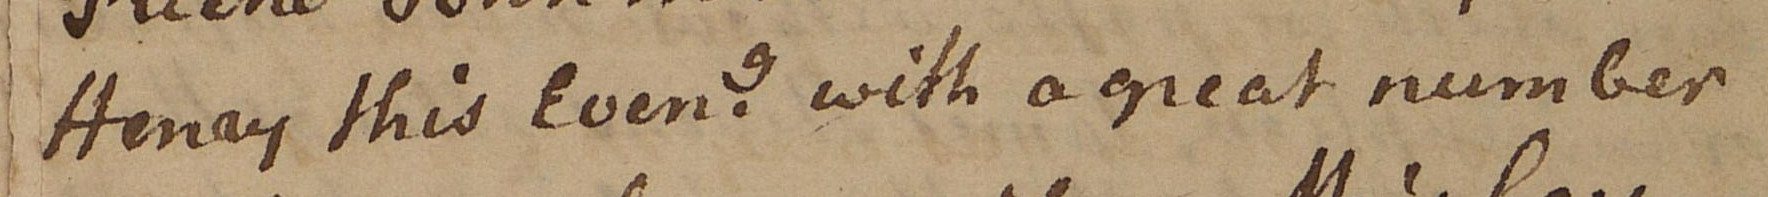Henry this Even^g. with a great number
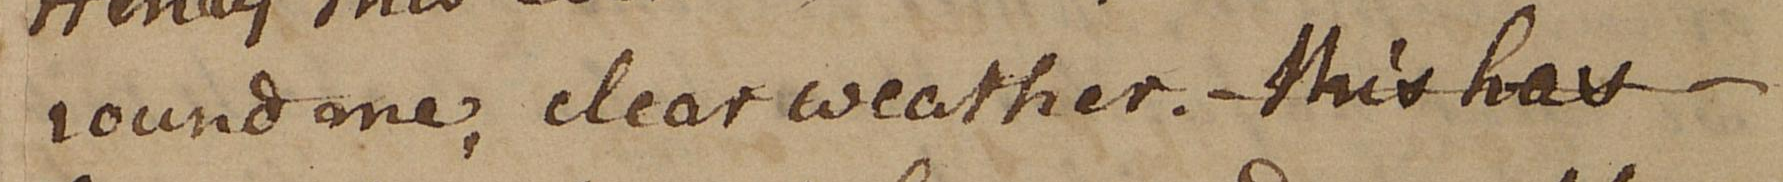round me, clear weather.- this has-
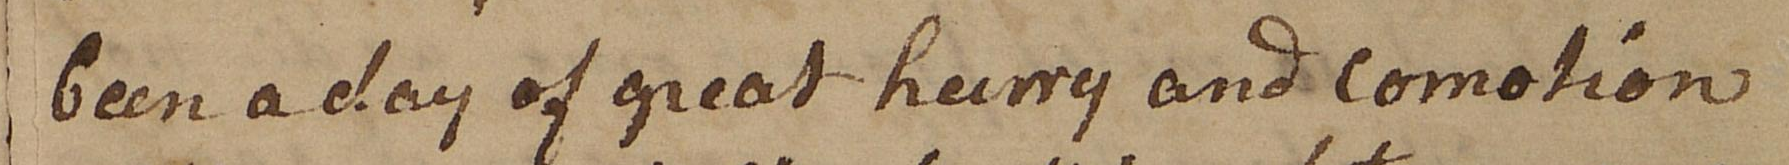been a day of great hurry and comotion
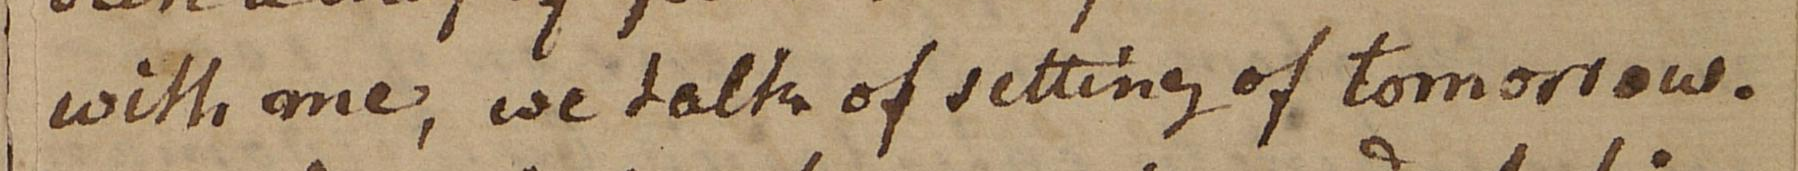with me, we talk of setting of tomorrow.
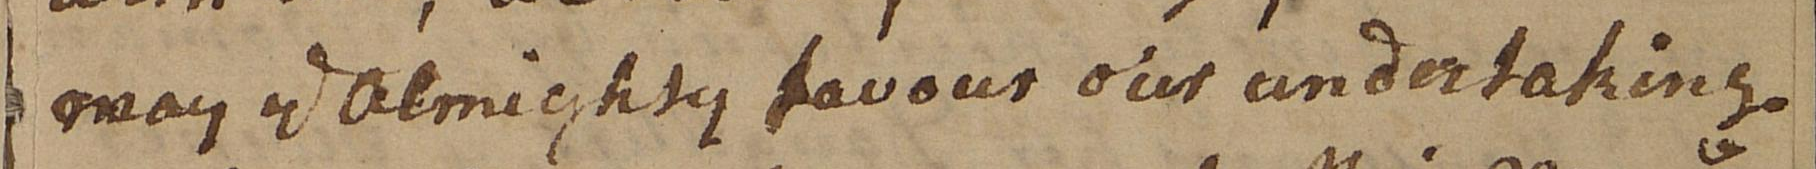may y^e Almighty favour our undertaking.
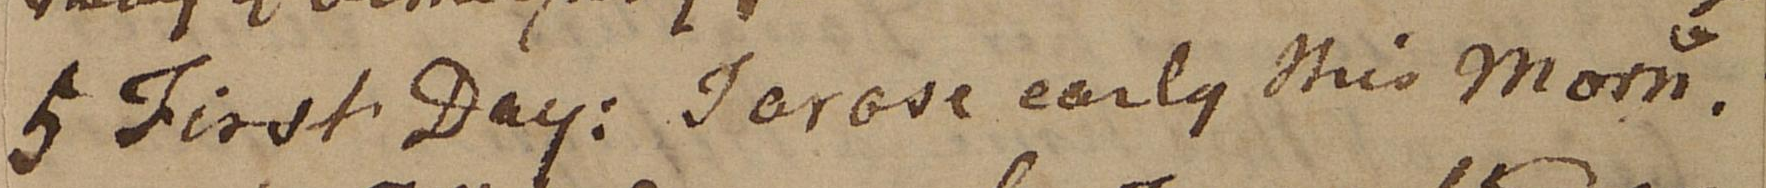5 First Day: I arose early this Morn^g.
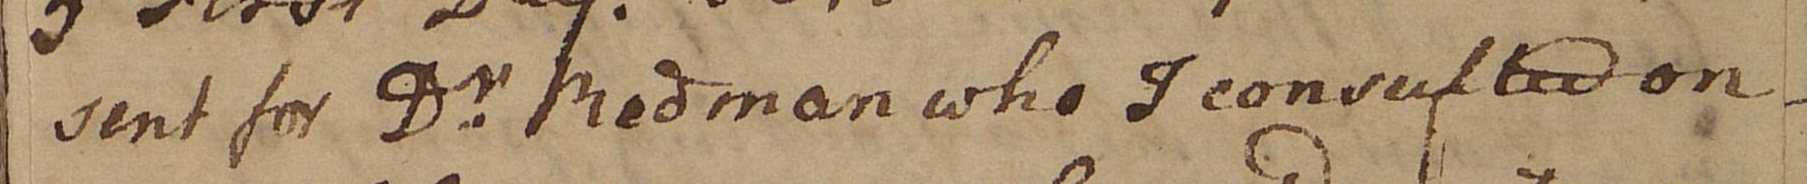sent for D^r. Redman who I consulted on
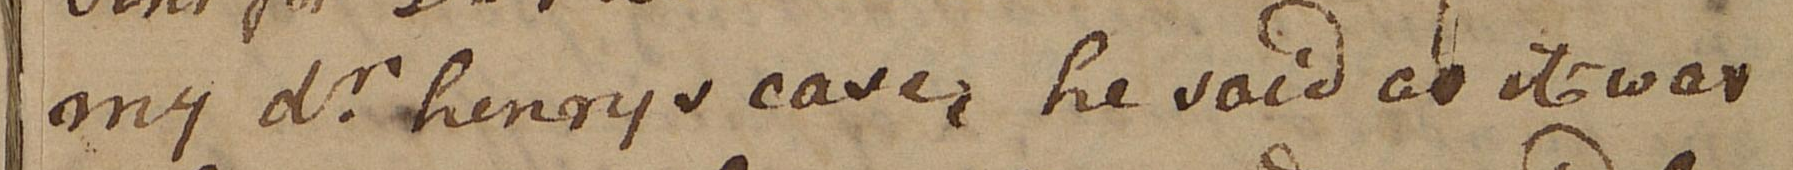my d^r. henrys cases he said as it was
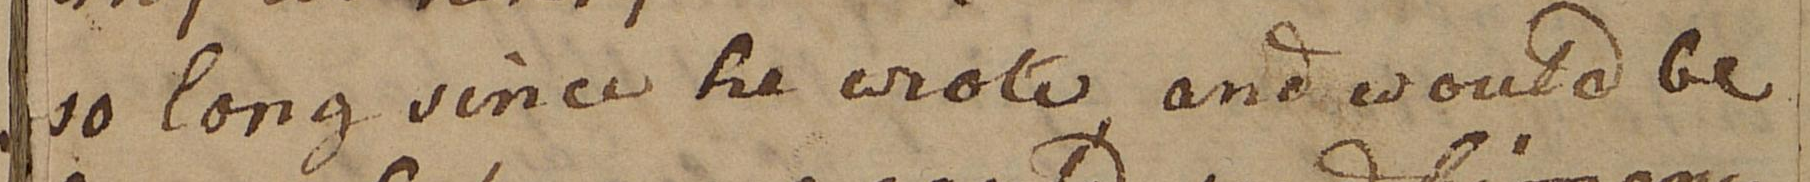so long since he wrote and would be
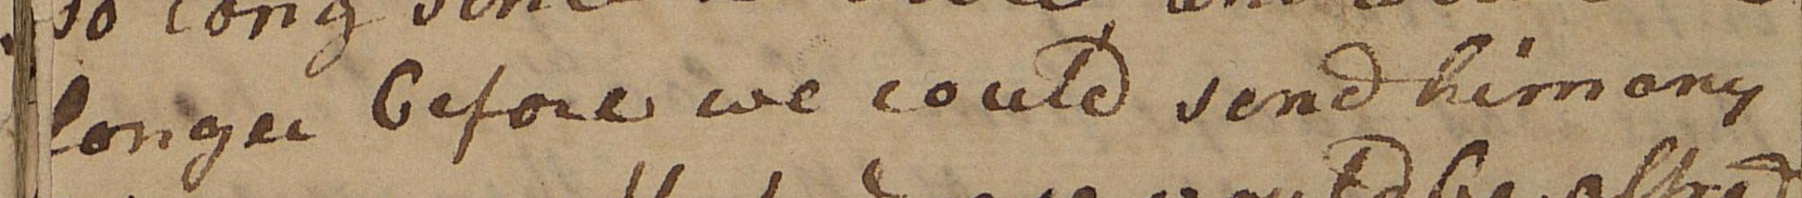longer before we could send him any
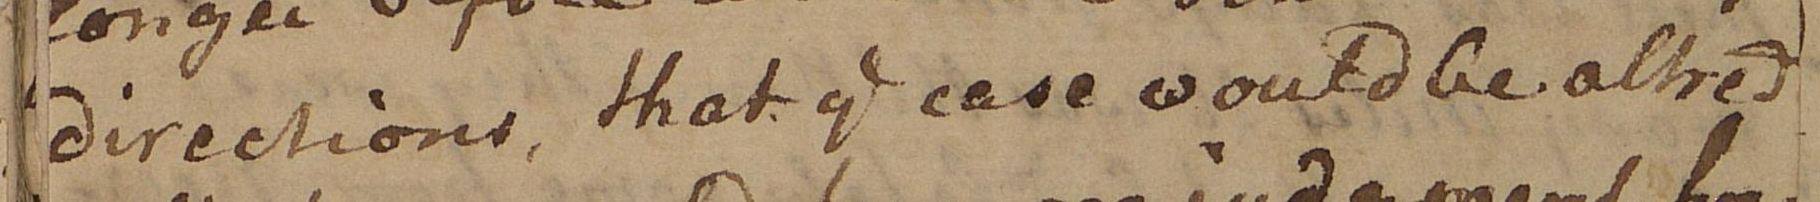directions, that y^e case would be altred
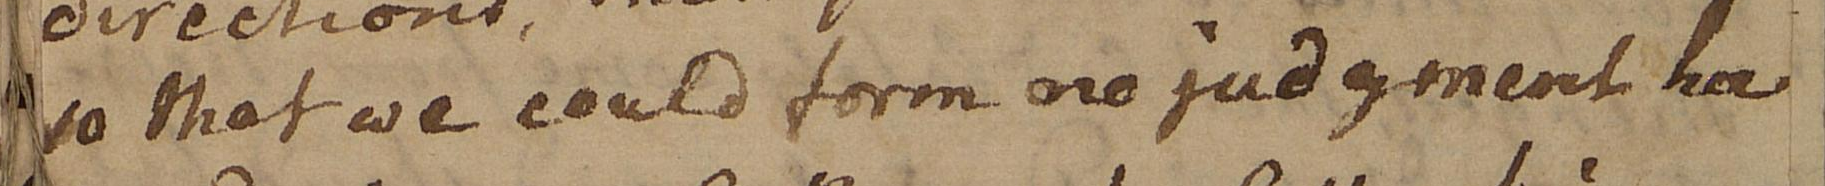so that we could form no judgment her
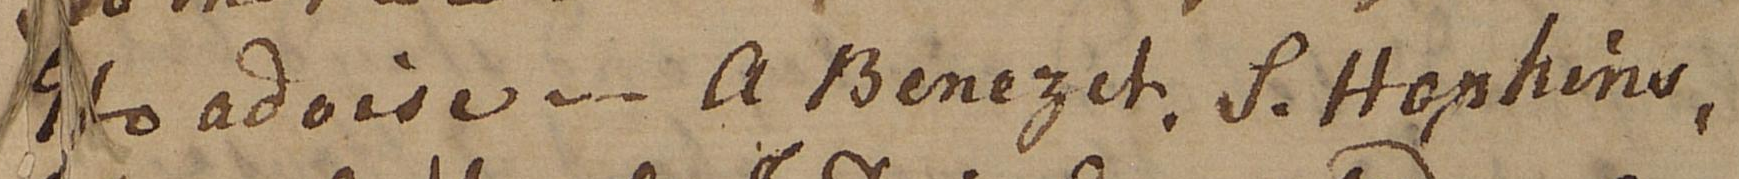to advise- A Benezet, S. Hopkins,
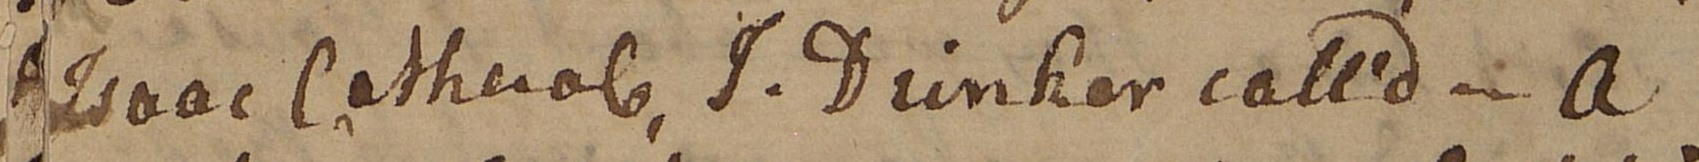Isaac Catheral, T. Drunker call'd- A
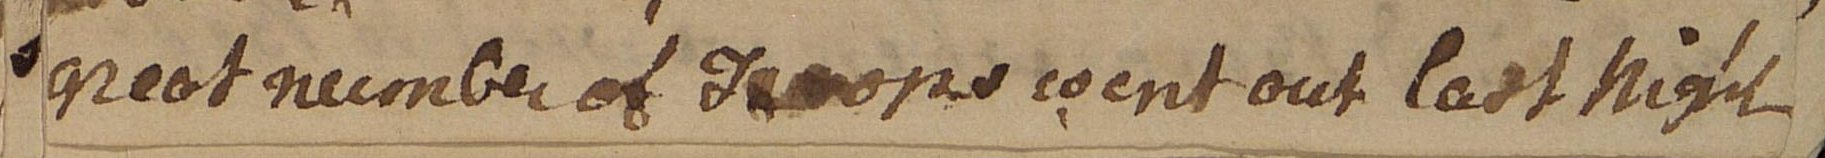great number of Troops went out last night
